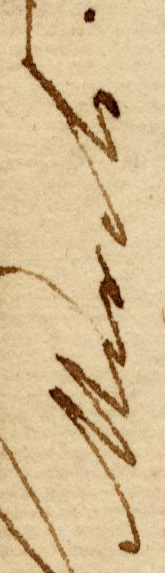Merch^t
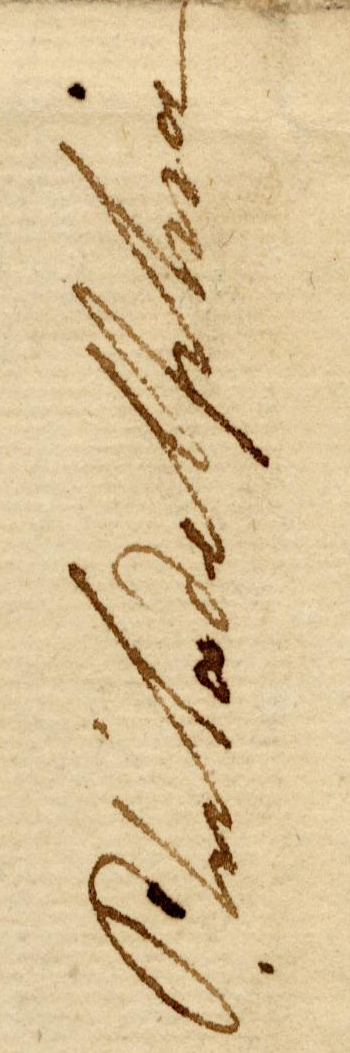Philadelphia
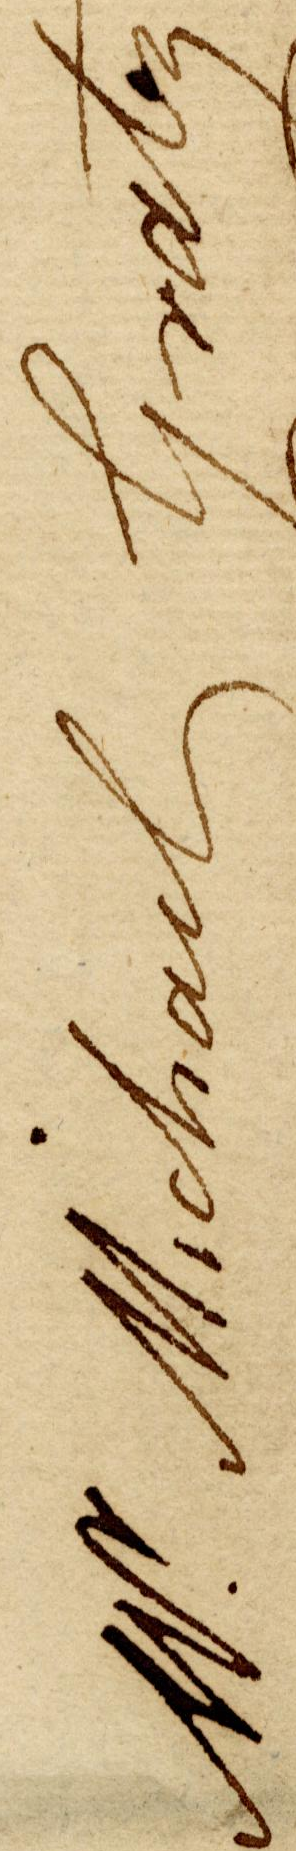M^r Michael Gratz
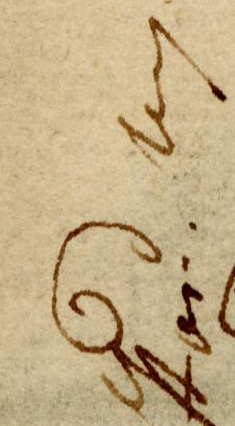hon^d by
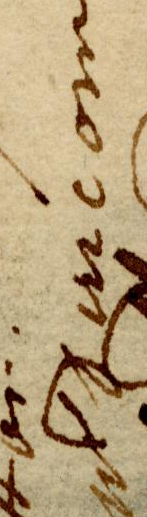M^r Duncan
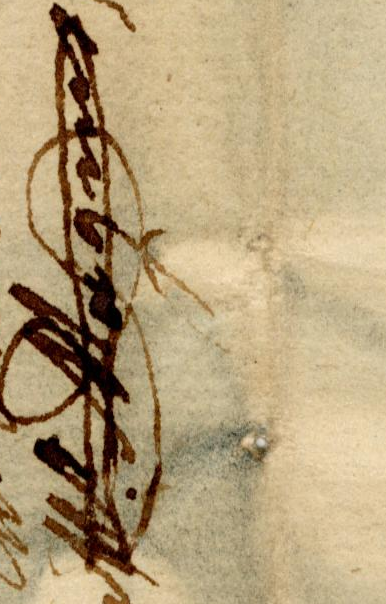[________]
